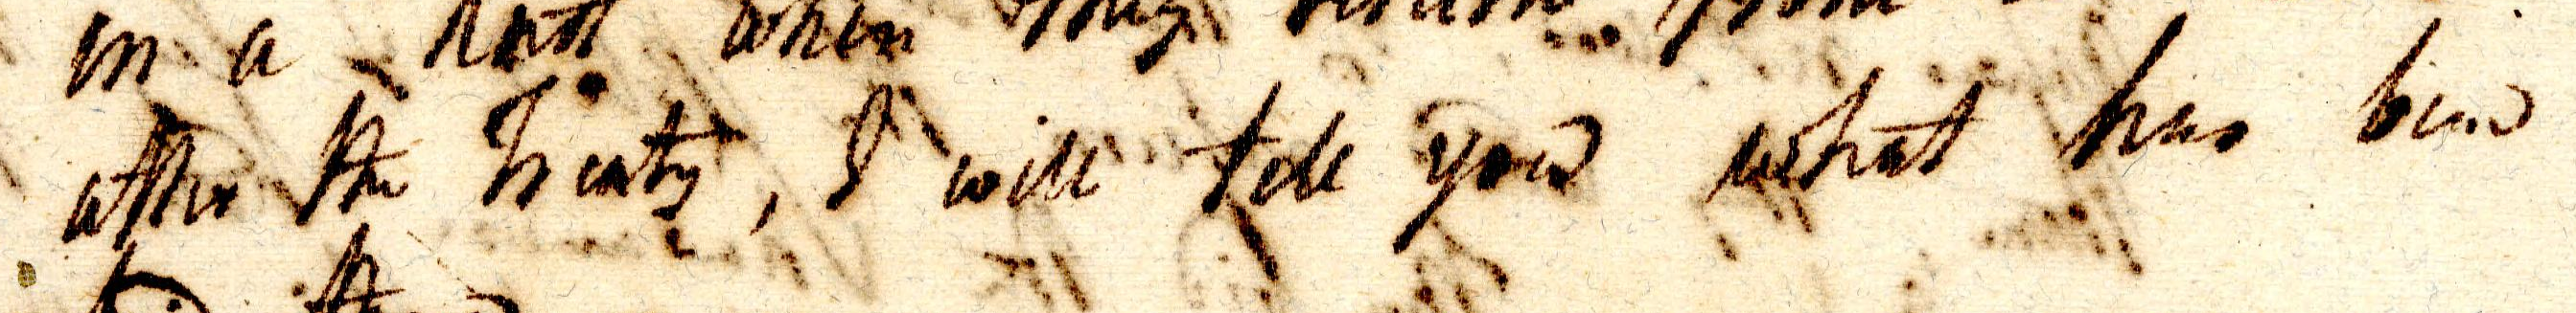after the Treaty, I will tell you what has been
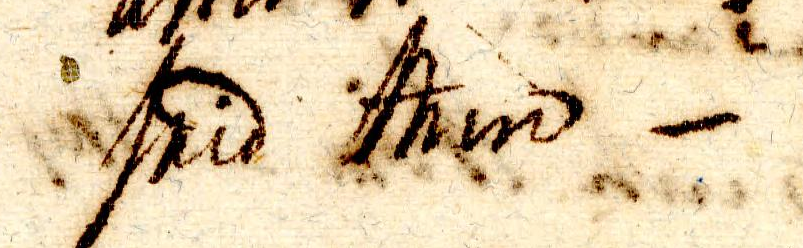said then-
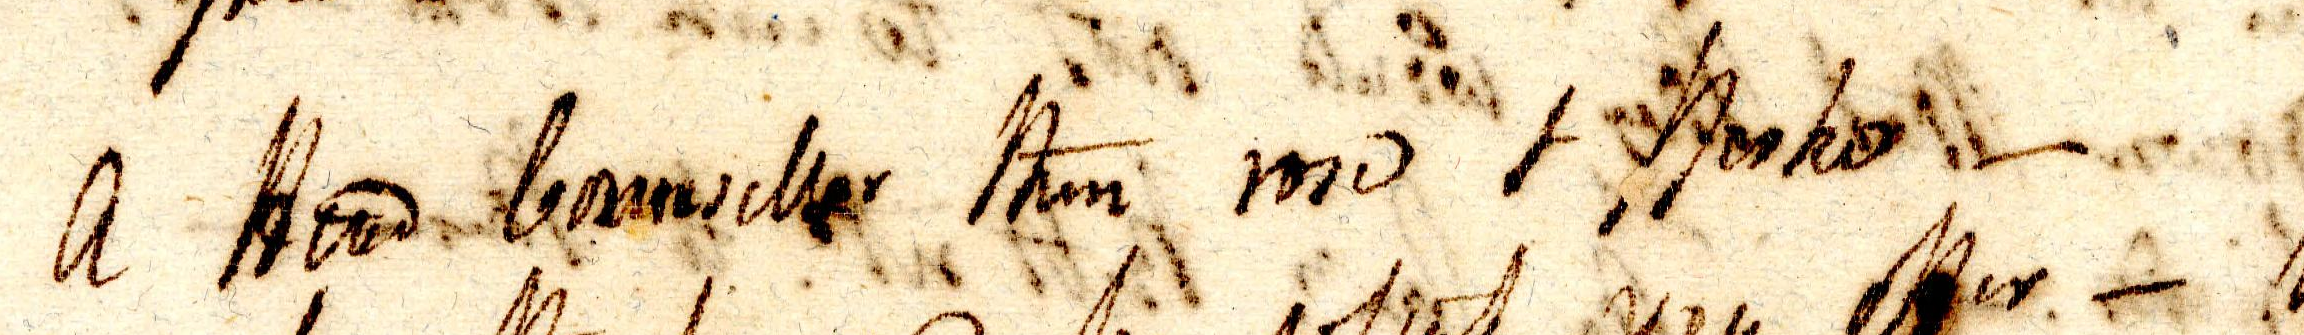A Head Counsellor then rose & spoke-
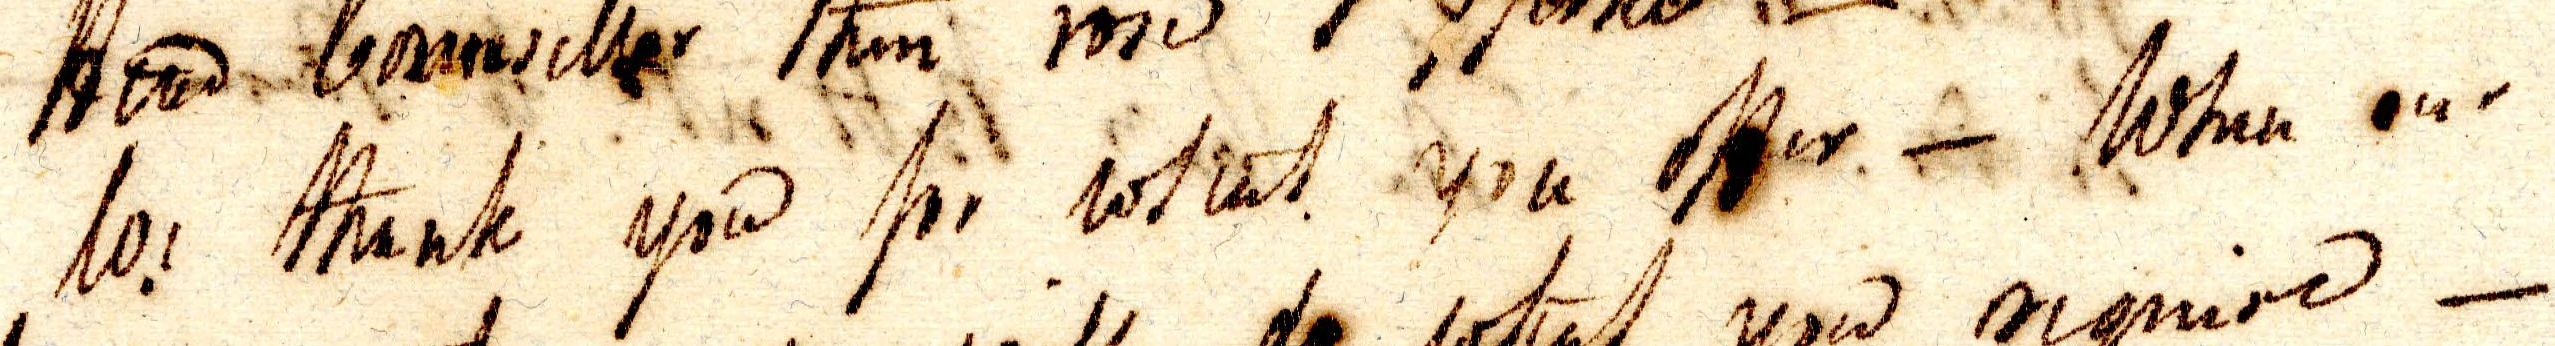We thank you for what you offer- When our
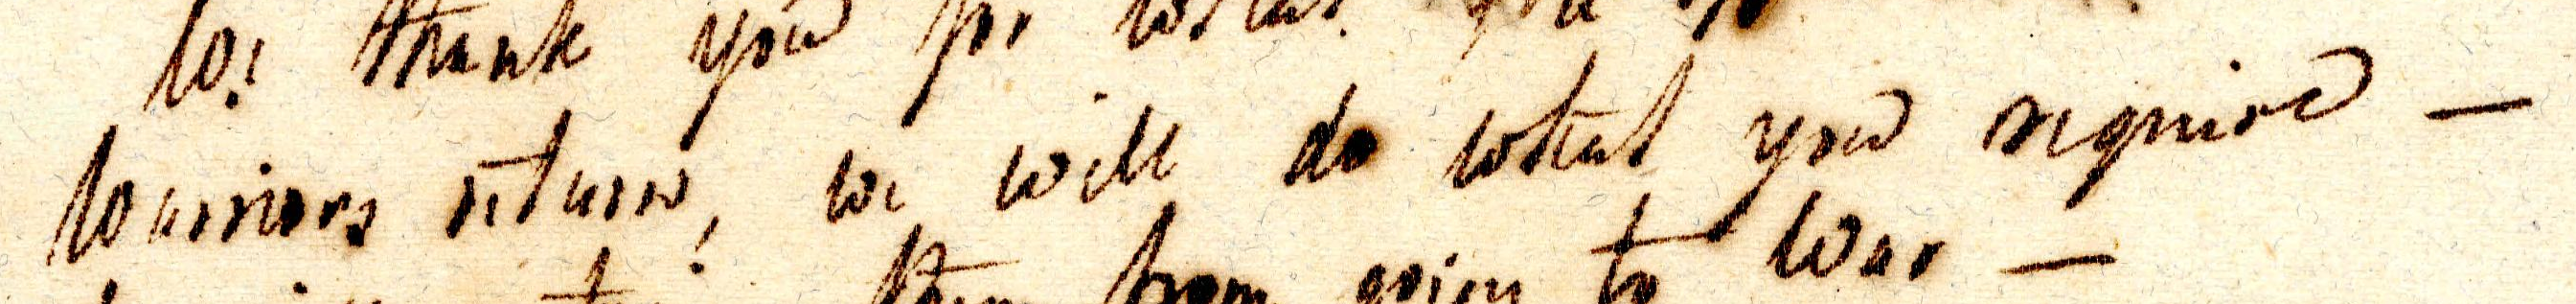Warriors return, we will do what you require-
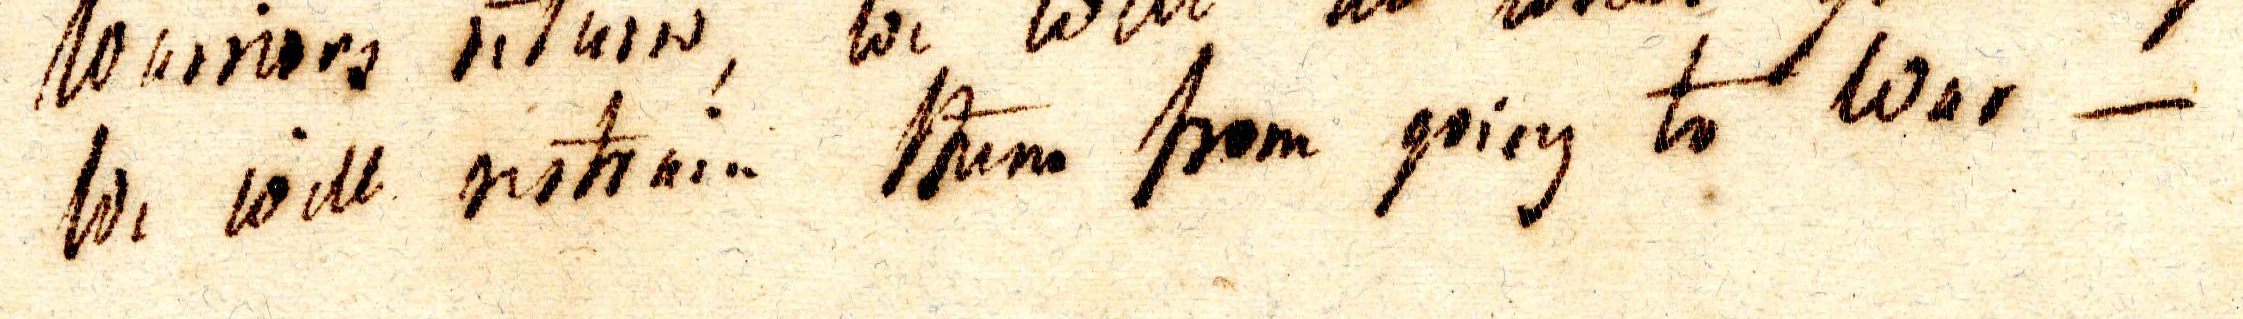We will restrain them from going to War-
